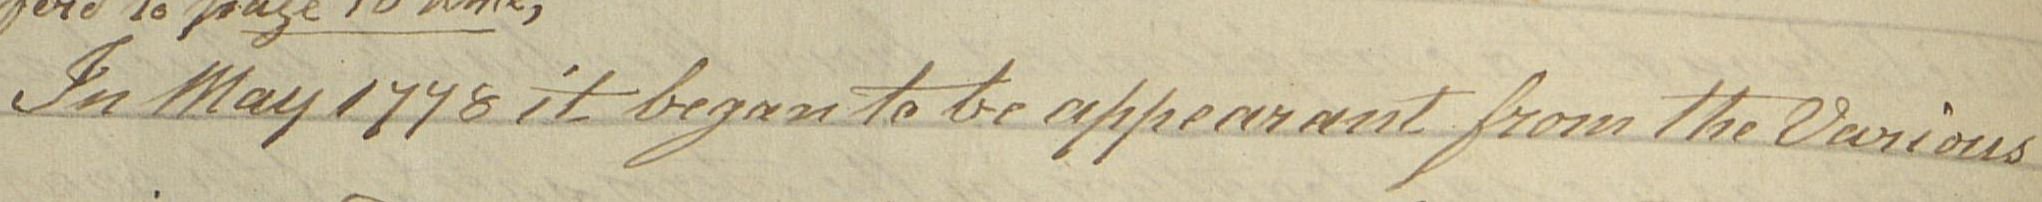In May 1778 it began to be appearant from the Various
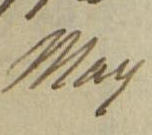May
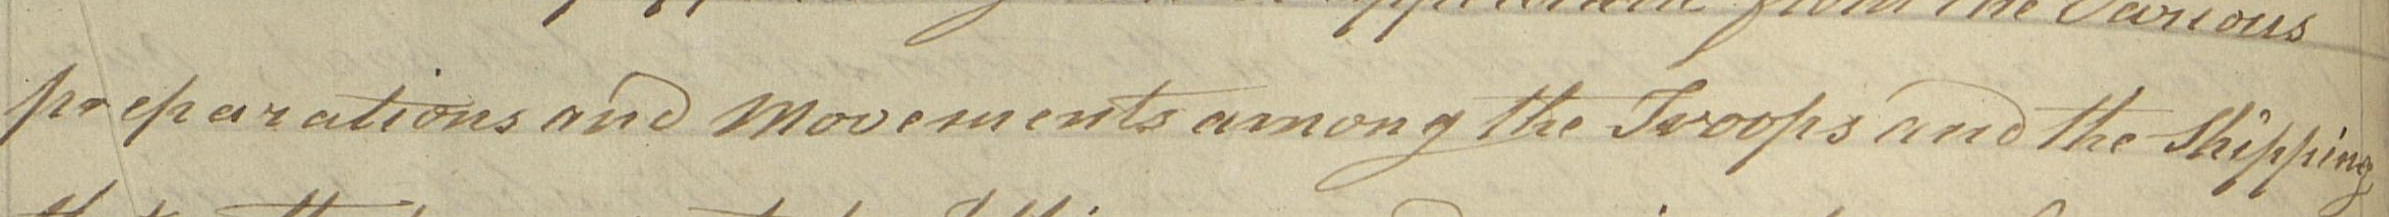preparations and Movements among the Troops and the shipping
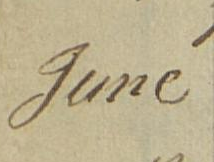June
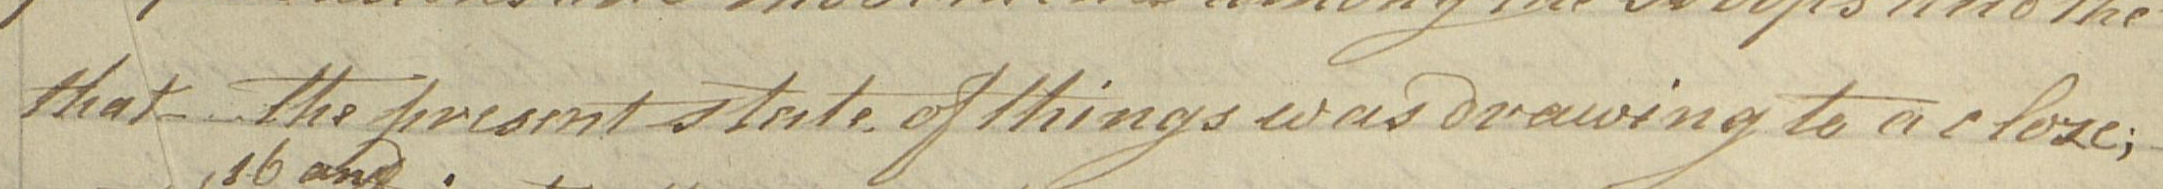that the present state of things was drawing to a close;
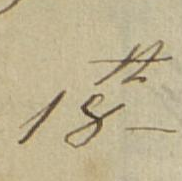18^th
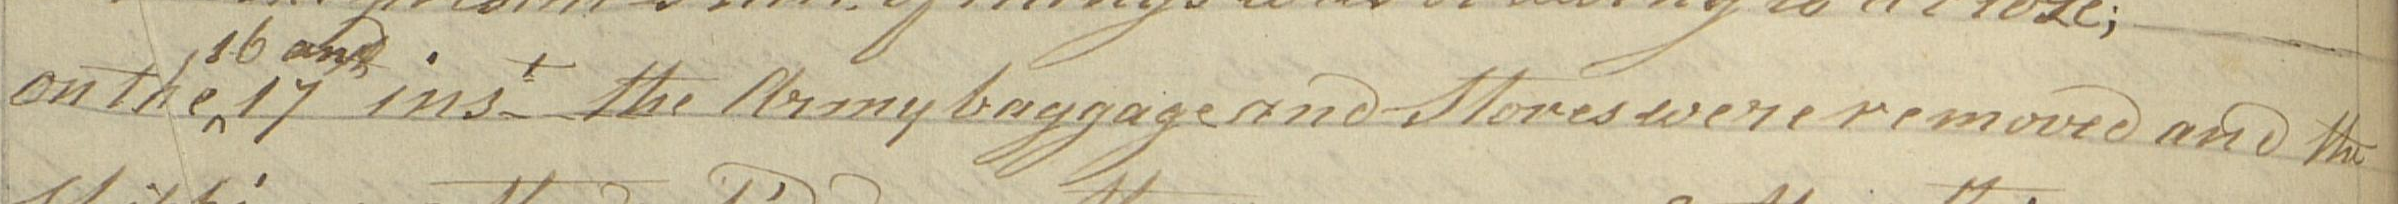on the ^ 17^th ins^t the Army baggage and Stores were removed and the
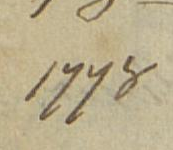1778
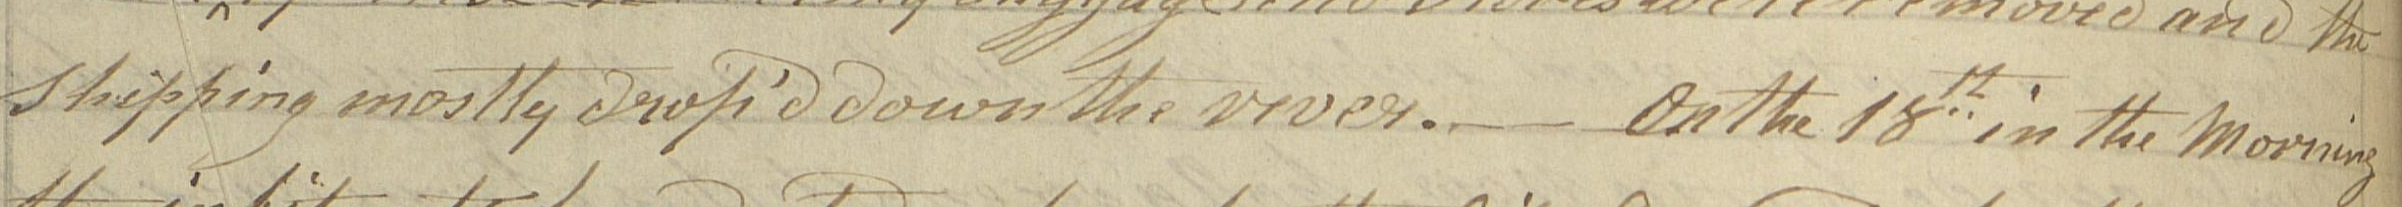Shipping mostly drop'd down the river. On the 18^th in the Morning
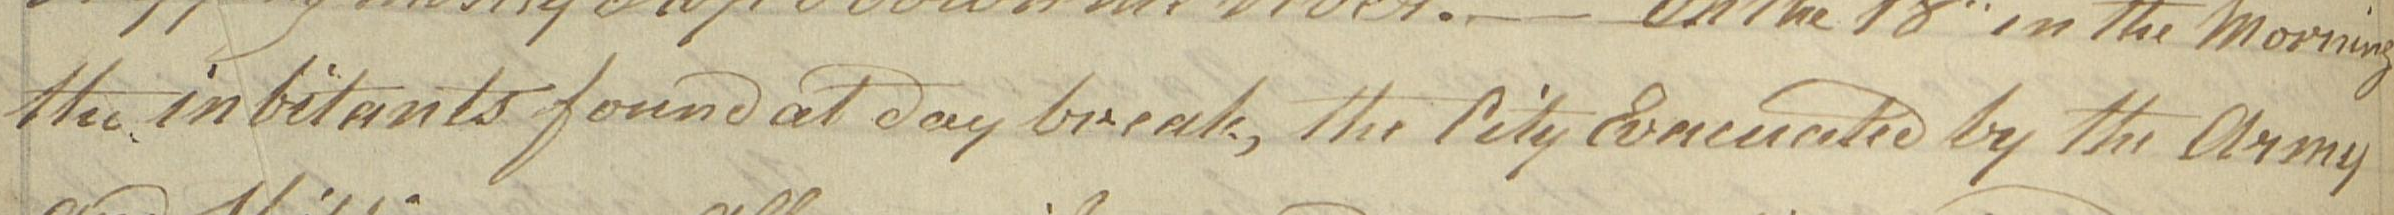the inbitants found at day break, the City Evacuated by the Army
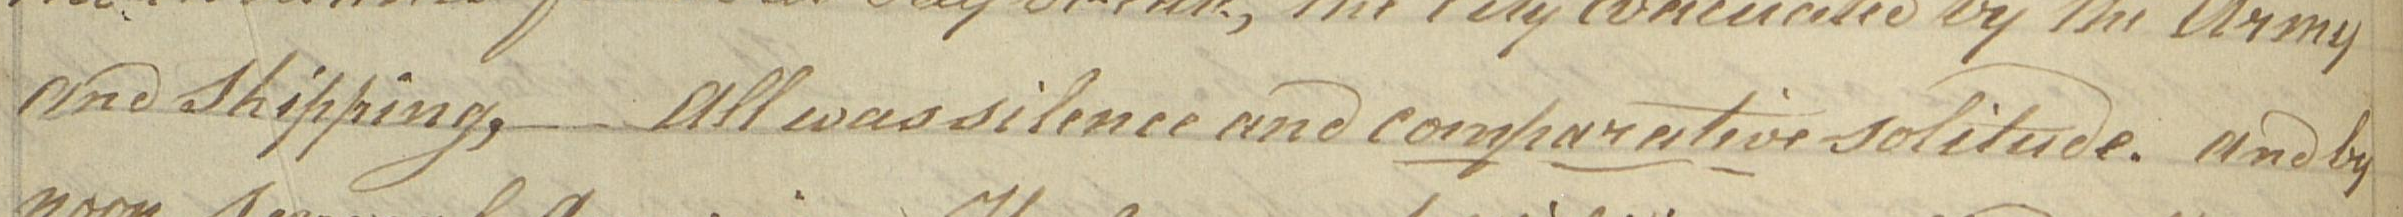and Shipping, All was silence and comparative solitude. and by
